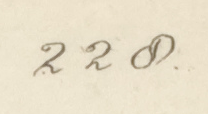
228.
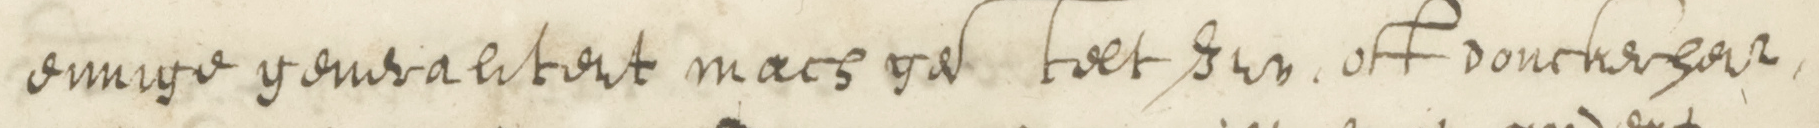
ennige generaliteyt mach gestelt zyn, oft donckerheyt,
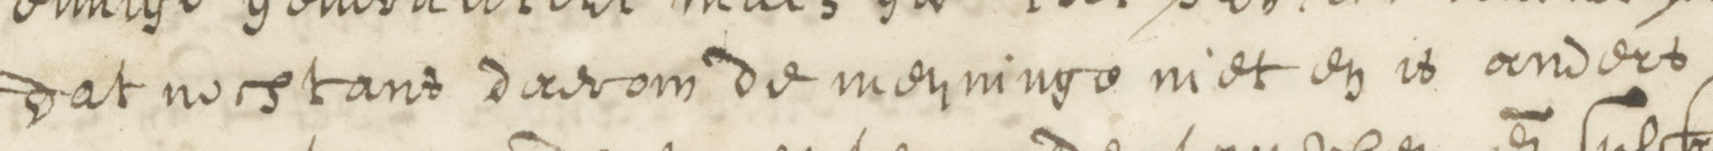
dat nochtans daerom de meyninge niet en is anders
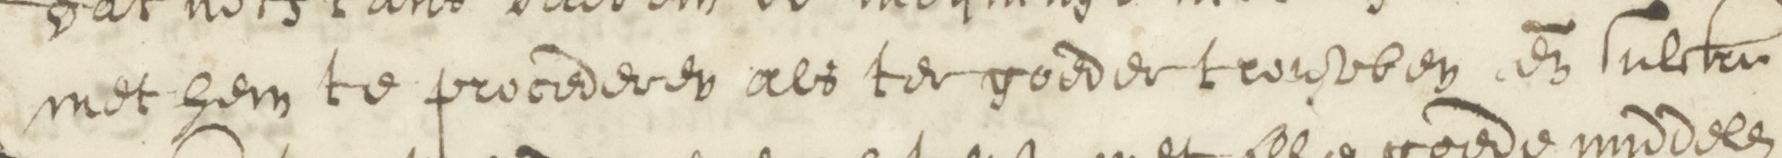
met hem te procederen als ter goedertrouwen en sulcke
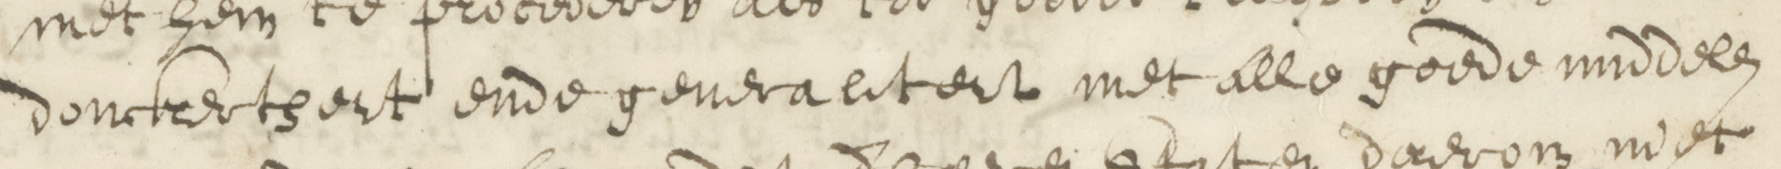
donckertheyt ende generaliteyt met alle goede middelen
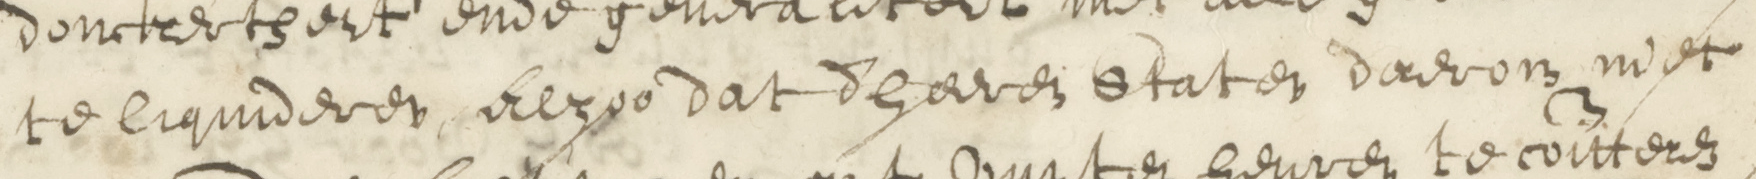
te liquideren, alzoo dat d'heeren Staten daerom niet
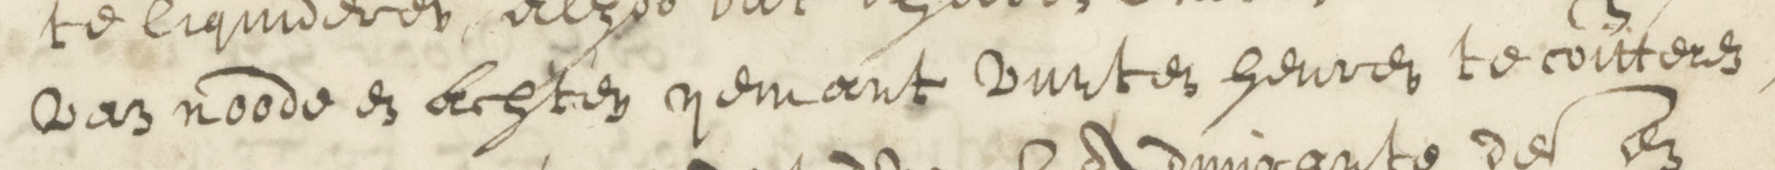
van noode en achten yemant vuyten heuren te coitteren
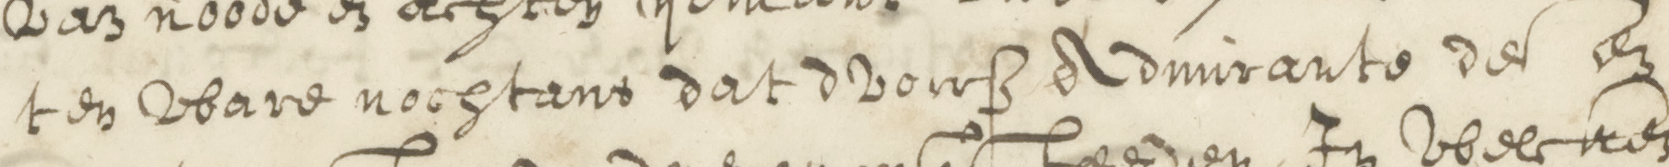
ten ware nochtans dat d'voirs Admirante desen
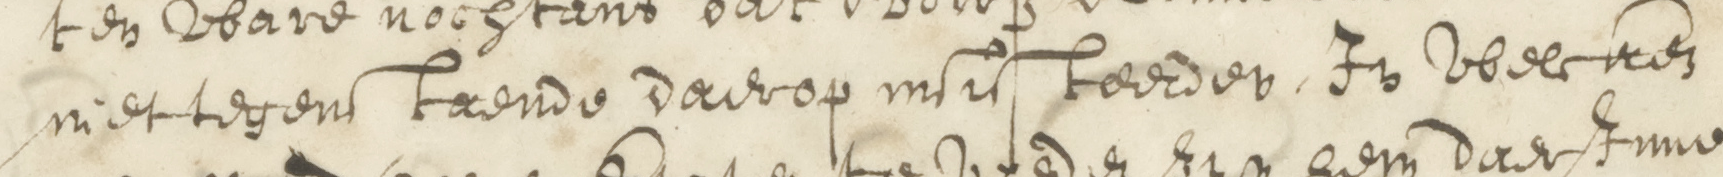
niet tegenstaende daerop insisteerden. In welcken
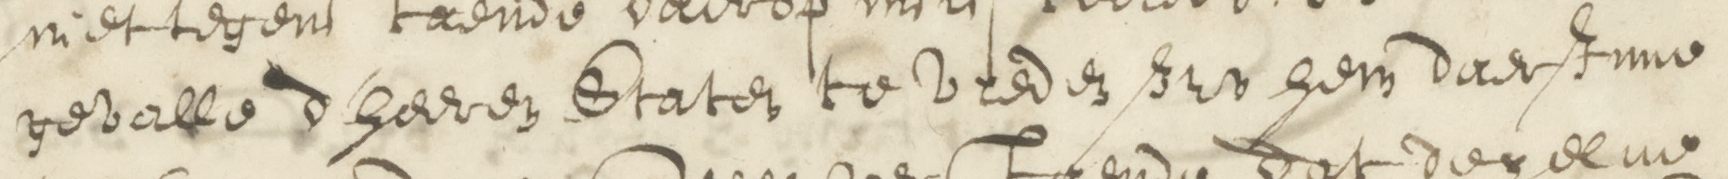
gevalle d'heeren Staten te vreden zyn hem daer Inne
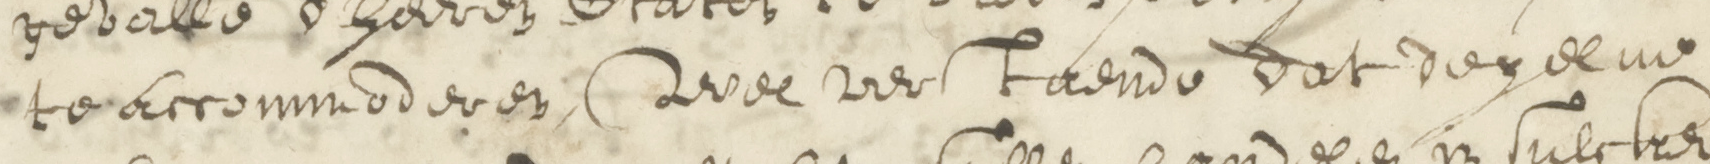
te accommoderen, wel verstaende dat dezelue
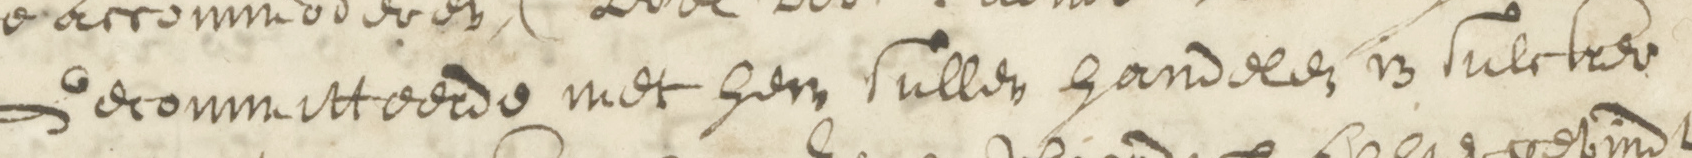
Gecommitteerde met hem sullen handelen in sulcker
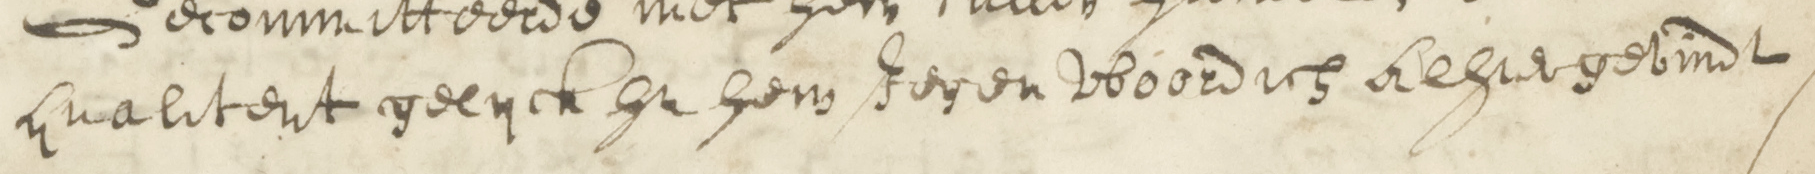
qualiteyt gelyck hy hem Jegenwoordich alhier gevindt.
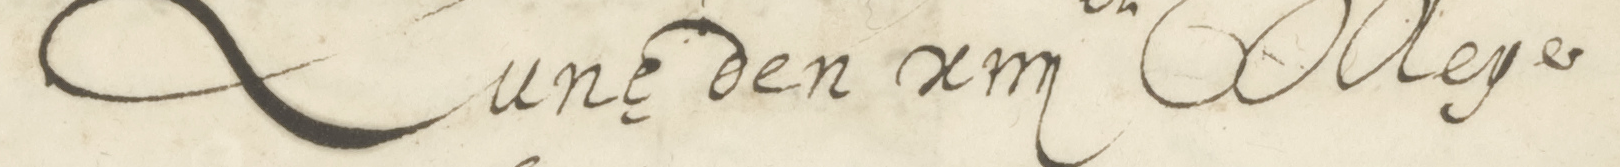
Lune den xviijen Meye
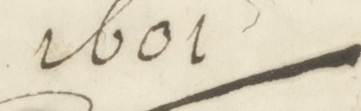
1601
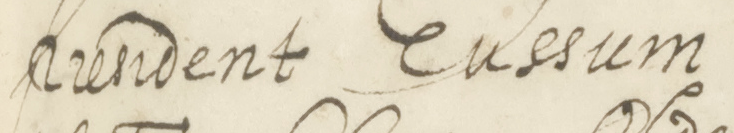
President Eussum
